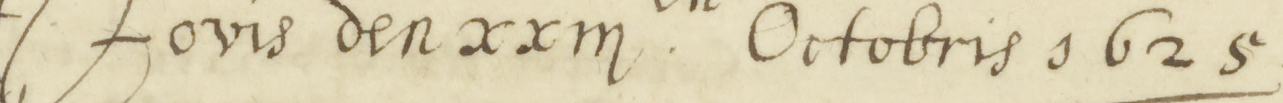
Jovis den xxiijen Octobris 1625
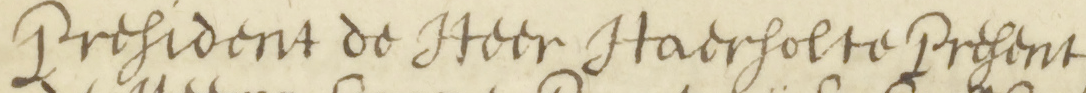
President de Heer Haersolte Present
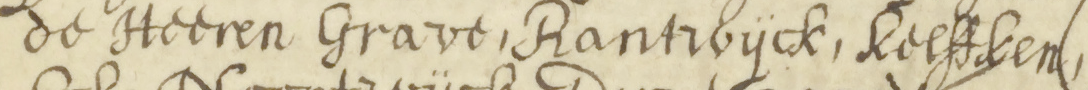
de Heeren Grave, Rantwijck, Kelffken,
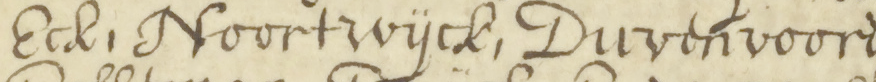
Eck, Noortwijck, Duvenvoorde,
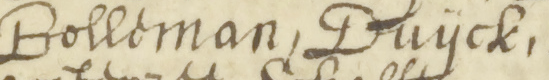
Bolleman, Duijck, Rode, Walta
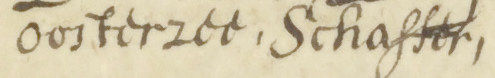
oosterzee, Schaffer,
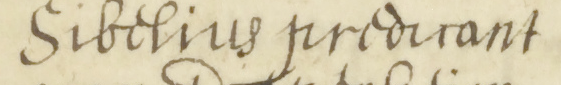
Sibelius predicant
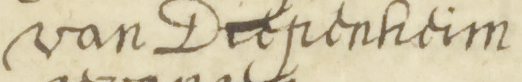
van Diepenheim
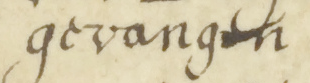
gevangen
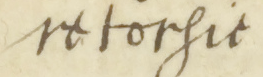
retorsie
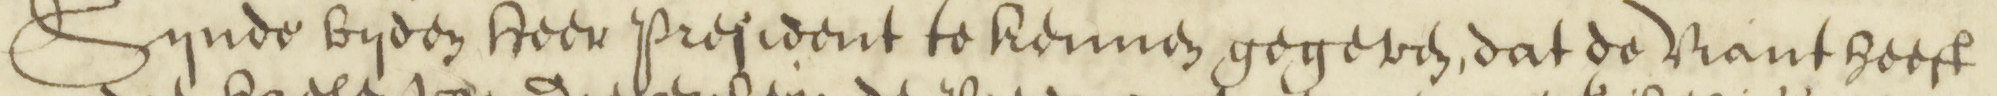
Synde byden heer President te kennen gegeven, dat de viant heeft
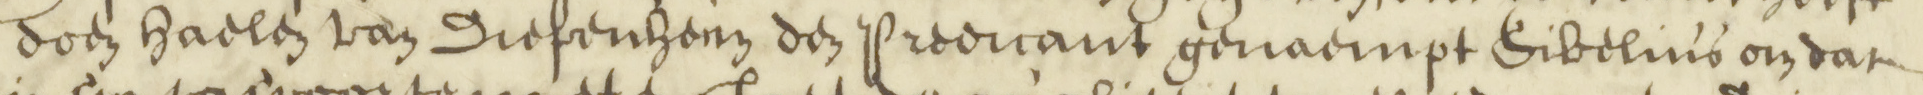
doen haelen van Diepenheim den Predicant genaempt Sibelius om dat
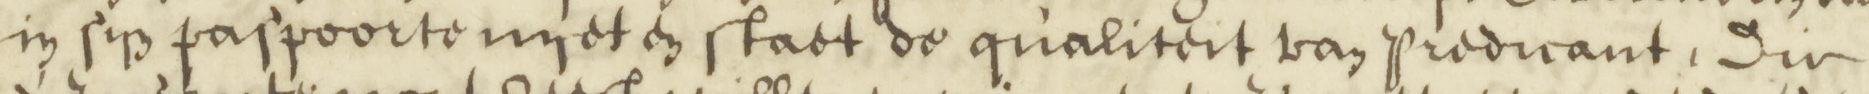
in syn paspoorte nyet en staet de qualiteit van Predicant, Die
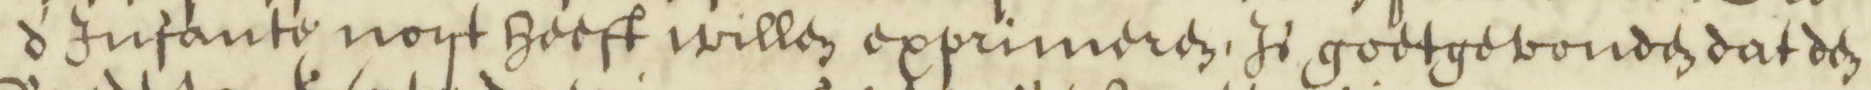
d‛Infante noyt heeft willen exprimeren, Is goetgevonden dat den
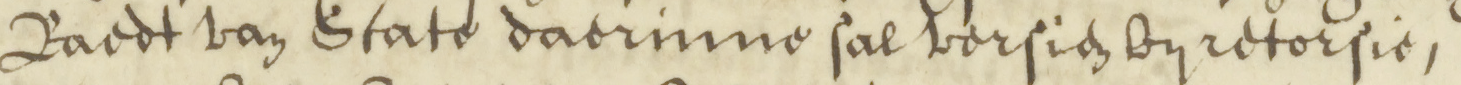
Raedt van State daerinne sal versien by retorsie.
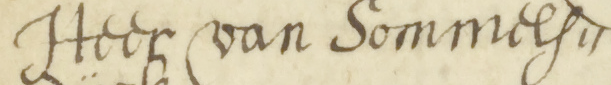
Heer van Sommels„
